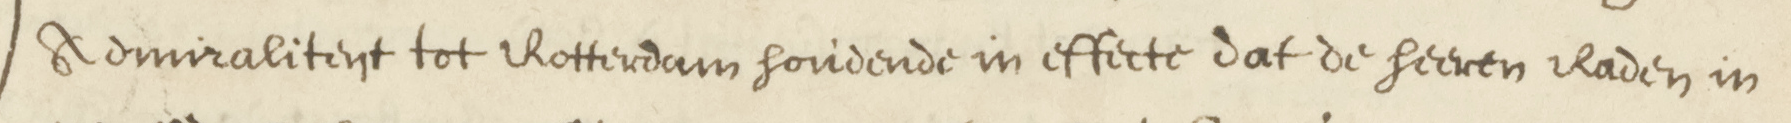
Admiraliteyt tot Rotterdam houdende in effecte dat de heeren Raden in
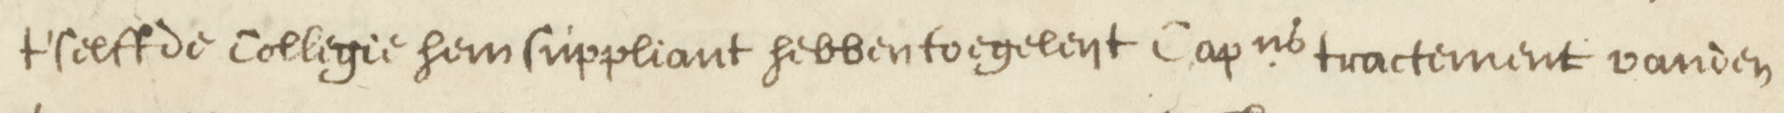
t'selffde Collegie hem suppliant hebben toegeleyt Capns. tractement vanden
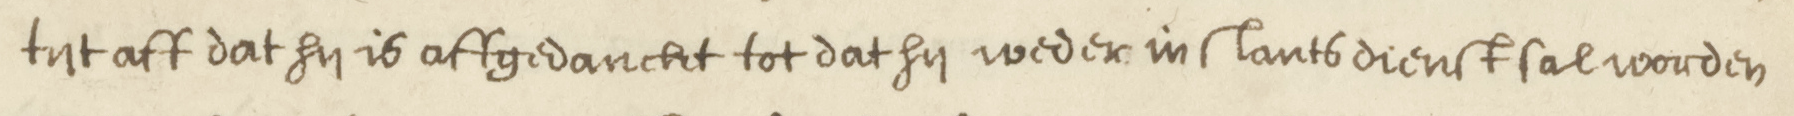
tyt aff dat hy is affgedanckt tot dat hy weder in slants dienst sal worden
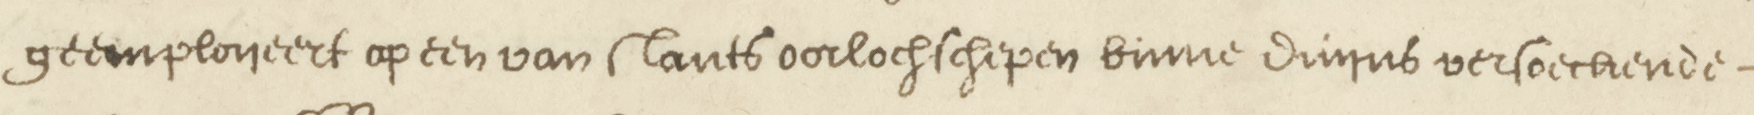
geemployeert op een van slants oorlochschepen binne duyns versoeckende
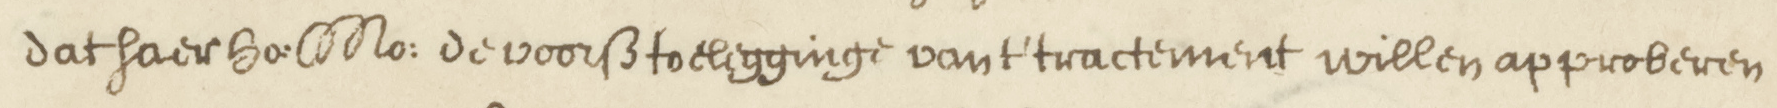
dat haer Ho:Mo: de voors toelegginge van t' tractement willen approberen
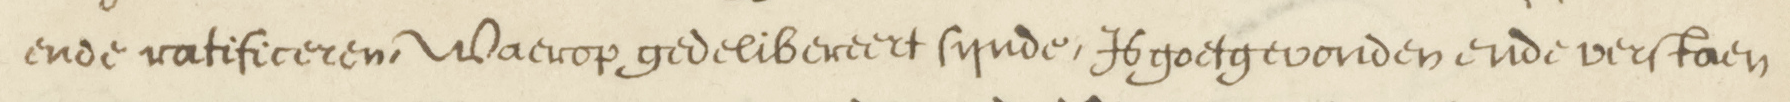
ende ratificeren. Waerop gedelibereert synde, Is goetgevonden ende verstaen
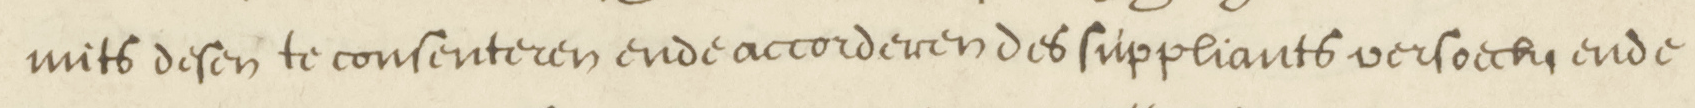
mits desen te consenteren ende accorderen des suppliants versoeck ende
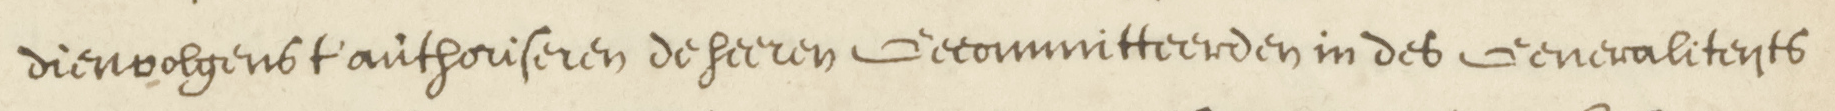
dienvolgens t'authoriseren de heeren Gecommitteerden in des Generaliteyts
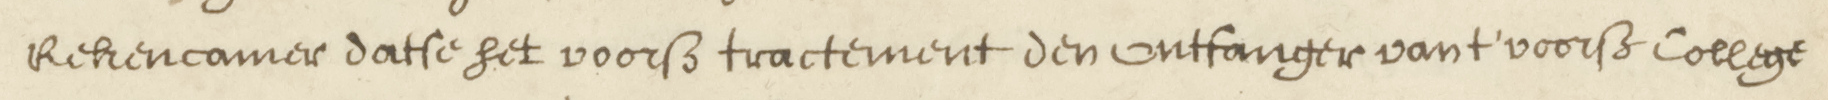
Rekencamer datse het voors tractement den Ontfanger van t' voors College
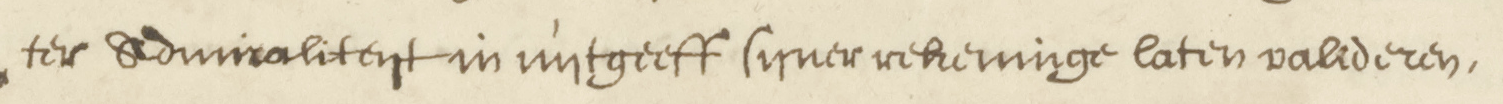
ter Admiraliteyt in uytgeeff syner rekeninge laten valideren.
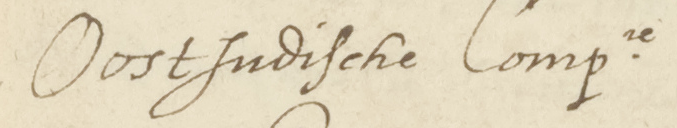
OostIndische Compie.
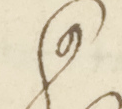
Ca
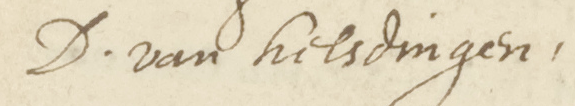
D. van helsdingen.
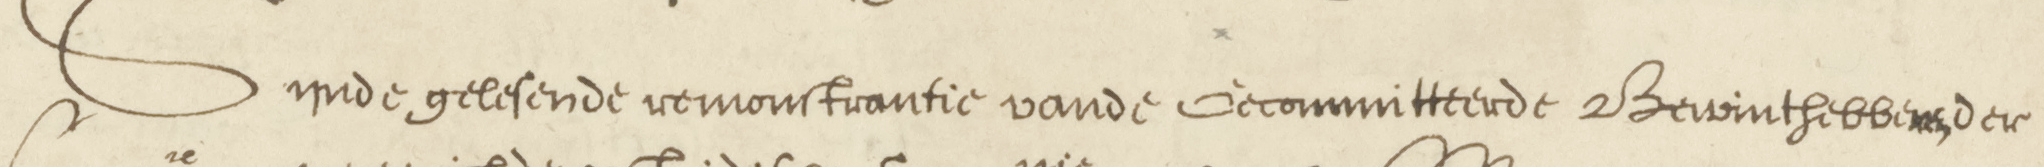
Synde gelesen de remonstrantie vande Gecommitteerde Bewinthebberen der
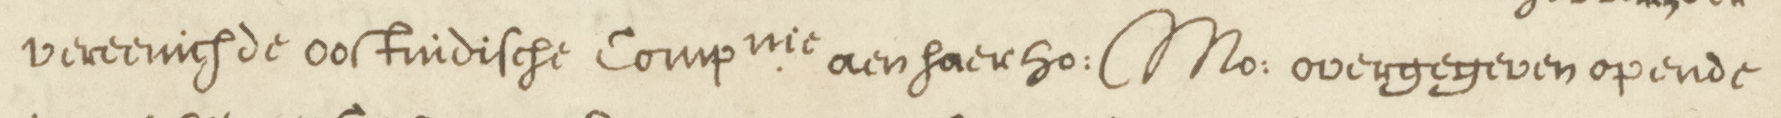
vereenichde oostindische Compnie. aen haer ho:Mo: overgegeven op ende
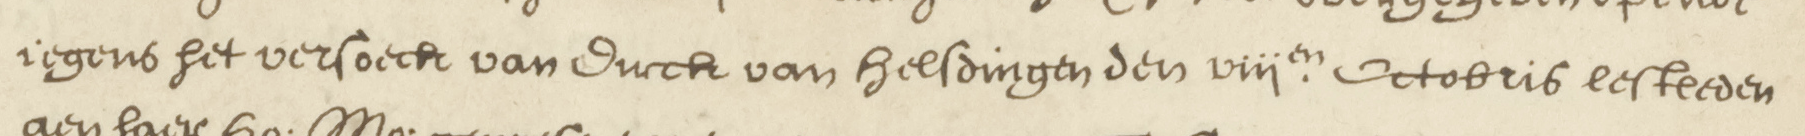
iegens het versoeck van Dirck van Helsdingen den viijen. Octobris lestleden
